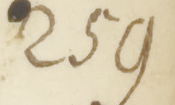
259
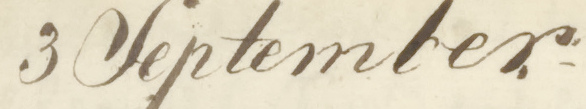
3 September.
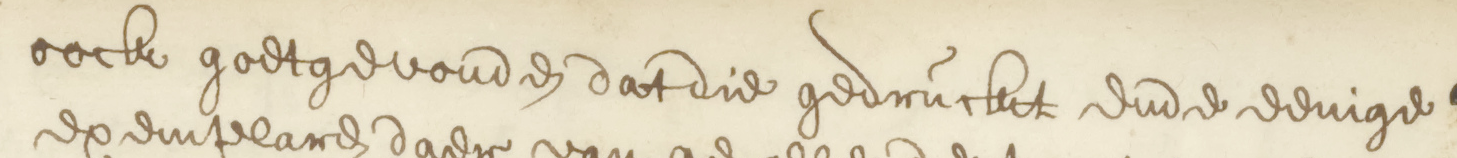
oock goetgevonden dat die gedruckt ende eenige
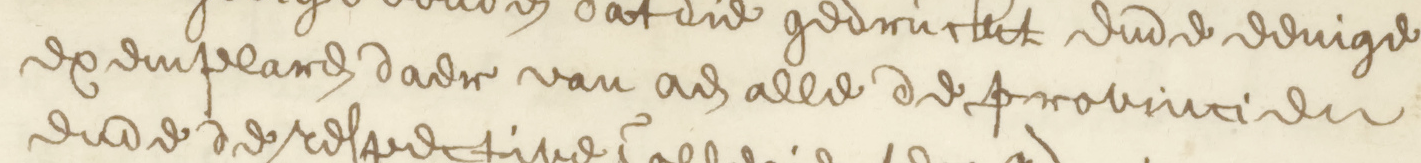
exemplaren daer van aen alle de provincien
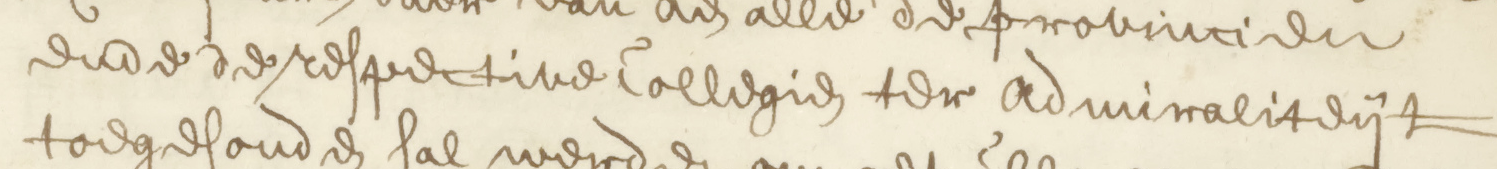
ende de respective Collegien ter Admiraliteijt
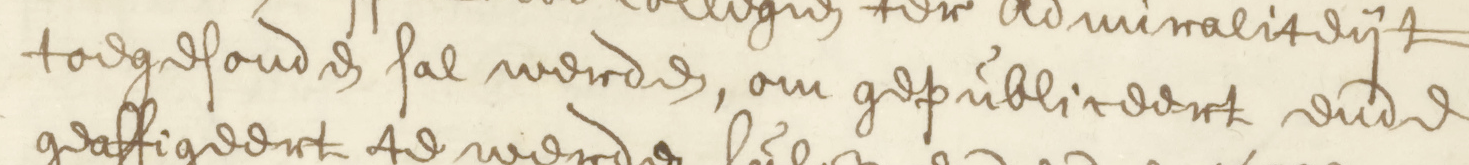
toegesonden sal werden, om gepubliceert ende
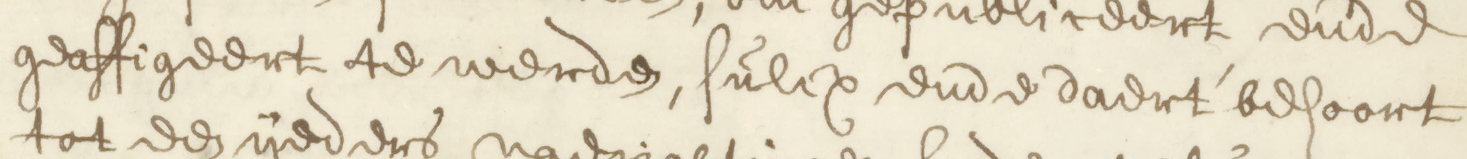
geaffigeert te werden, sulcx ende daert' behoort,
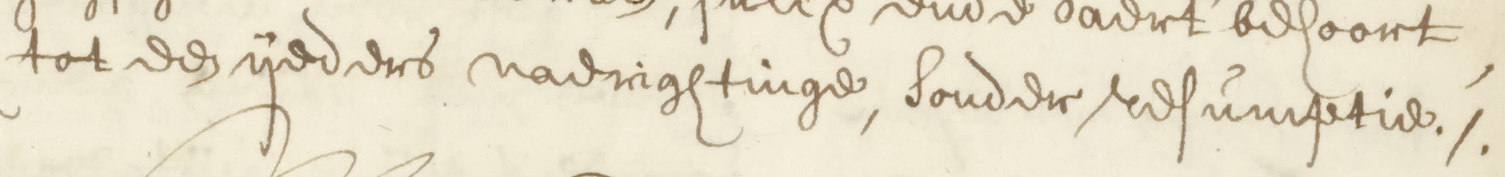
tot een ijeders naerightinge, sonder resumptie./.
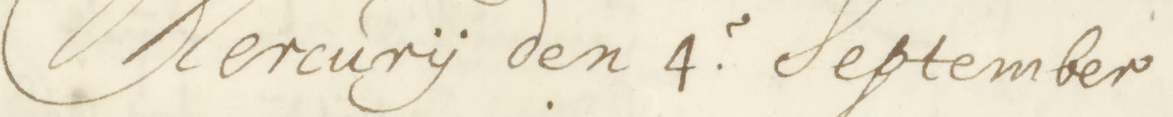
Mercurij den 4en. September
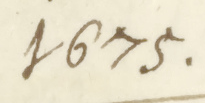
1675.
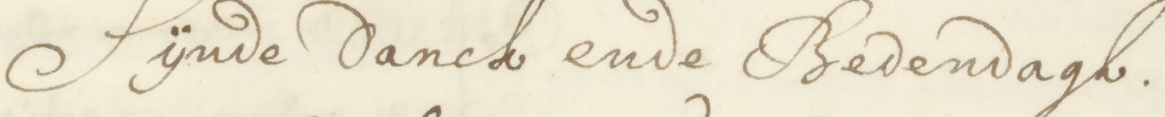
Sijnde Danck ende Bedendagh.
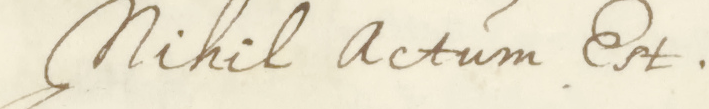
Nihil Actum Est.
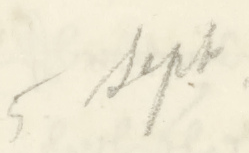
5 Sept.
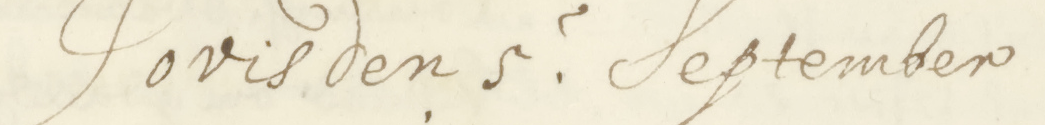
Jovis den 5en. September
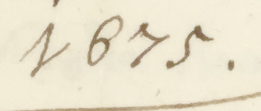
1675.
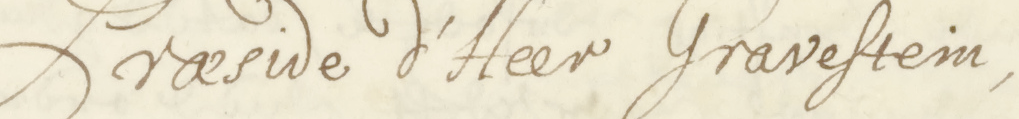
Præside d'Heer Gravestein,
